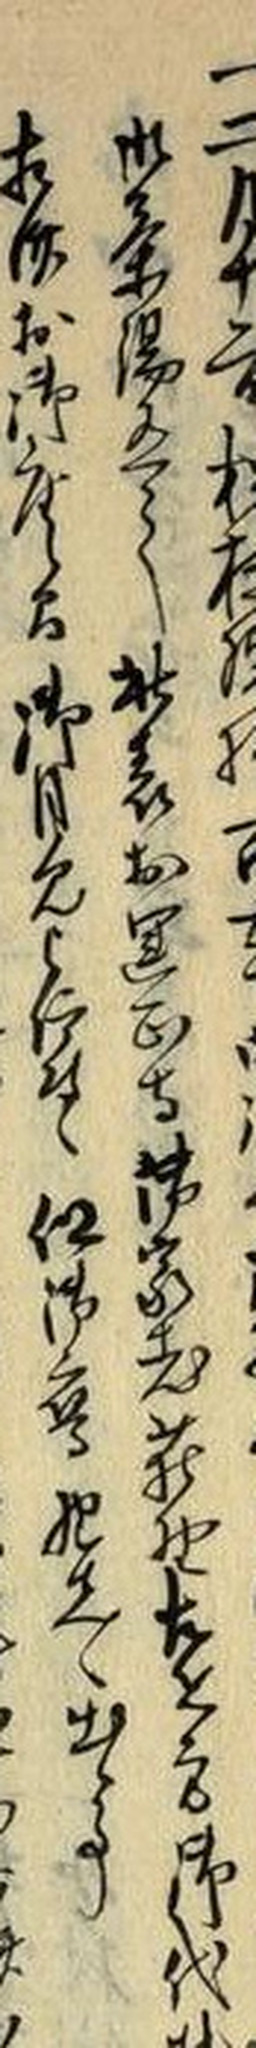相済於御座之間御目見被仰付候但御鷹野先へ出候事
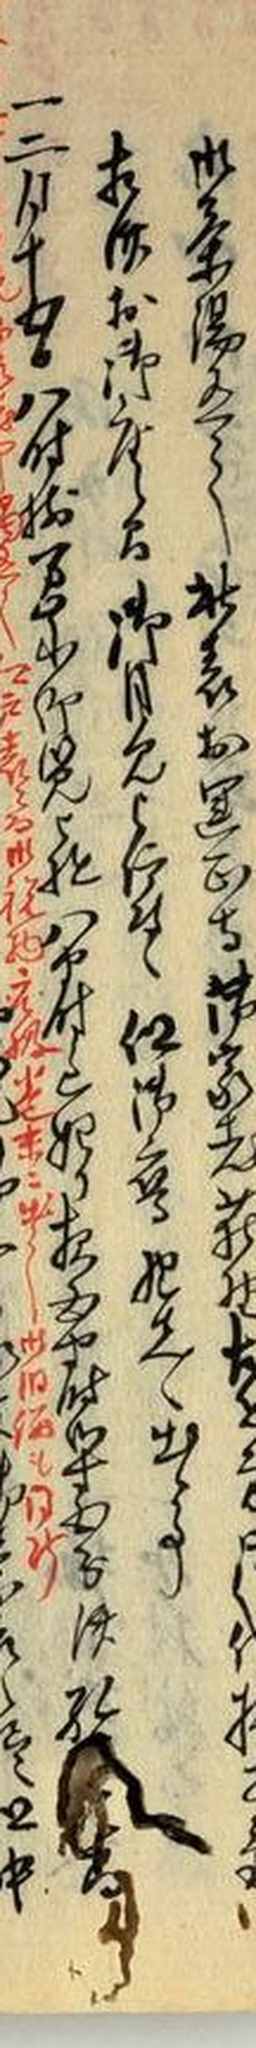一二月十五日八時揃万歳御覧被遊八半時過始り夜五半時弐寸五分済孔雀之間
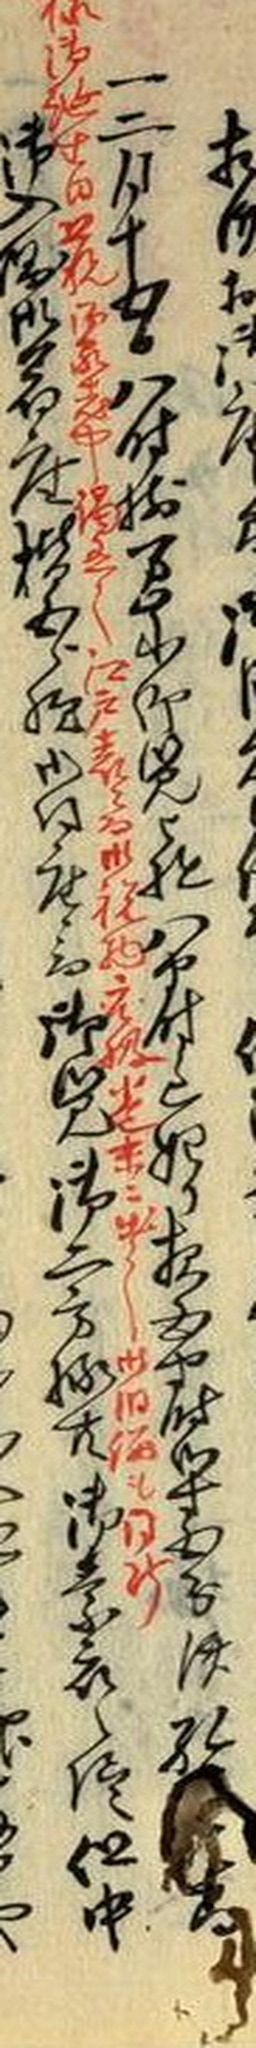御入側御着座揩五郎様御同座ニ而御覧御二方共御素衣之儘但中
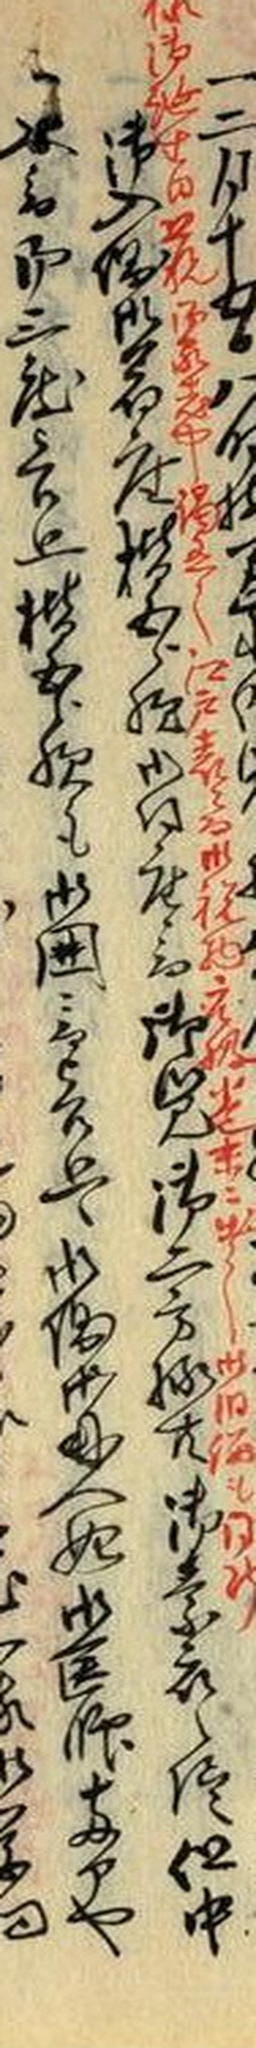入ニ而御三度被召上揩五郎様も御囲ニ而被召上候御側御用人始御医師両部や
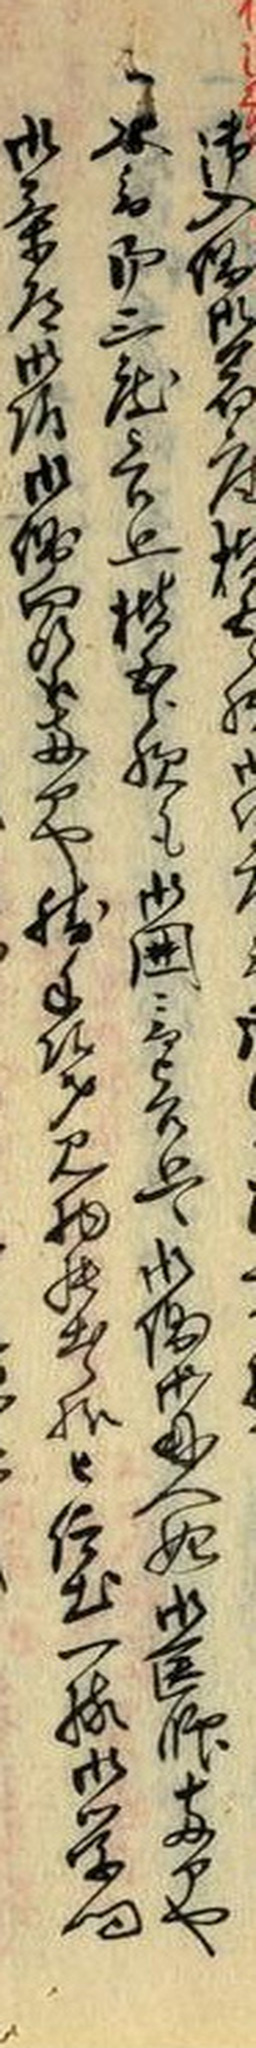御茶道御附側御側向頭取両部や勝手次第見物罷出候様被仰出一統御学問
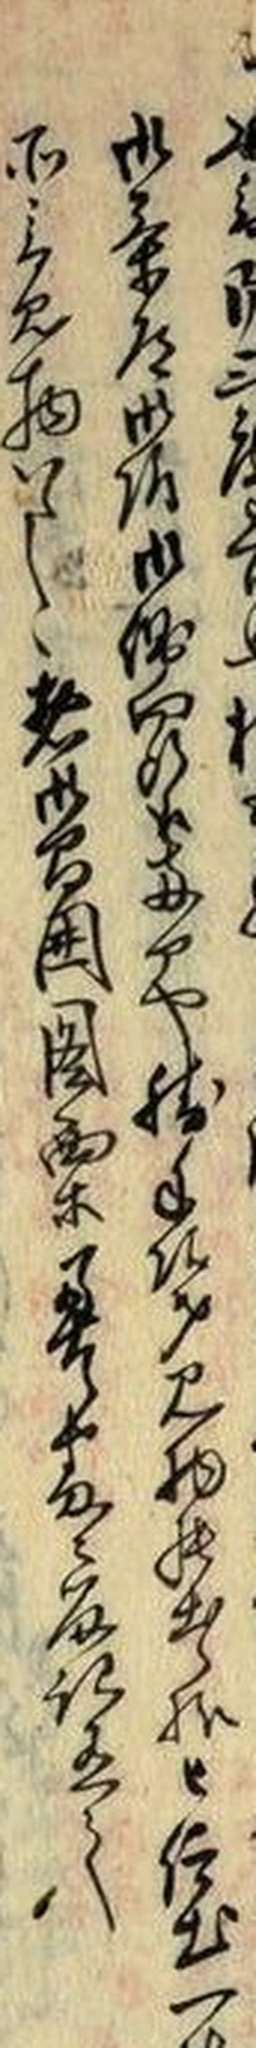所ニ而見物いたし候惣御間囲図面等奥之番ニ留記有之
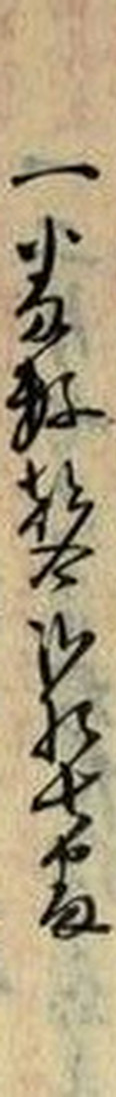一番数都合弐拾七番
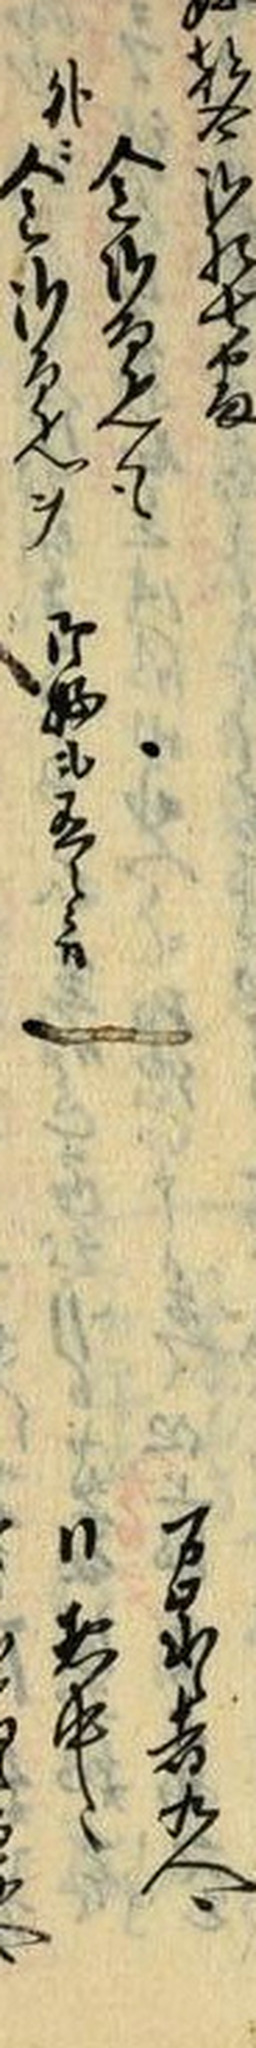外ニ金弐百疋ヲ御好も有之ニ付同惣中へ
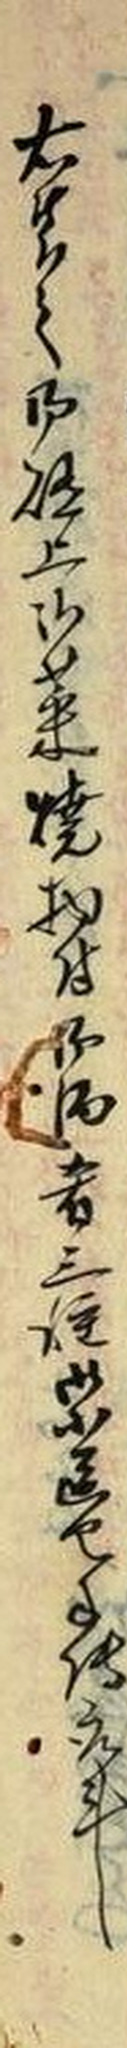右被下之御賄上弐菜焼物付御酒肴三種御小道具手伝取斗
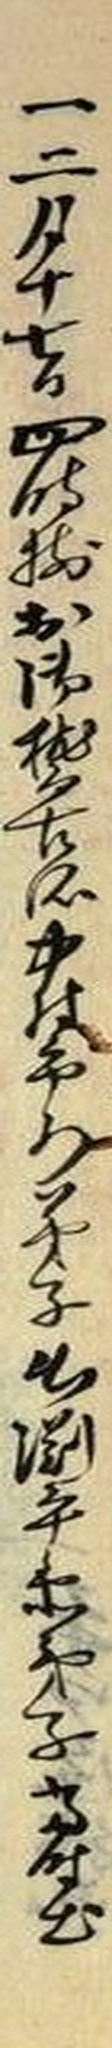一二月十七日四時揃於御稽古所中村市右衛門弟子出淵平兵衛弟子当時出
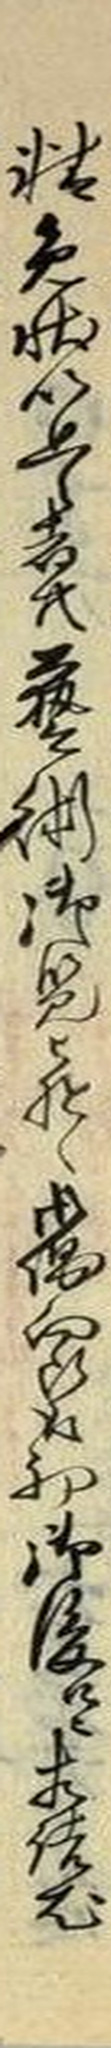精免状以上之者共釼術御覧被遊候御側向頭取初御後口二相詰尤
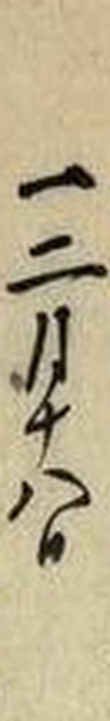一二月十八日
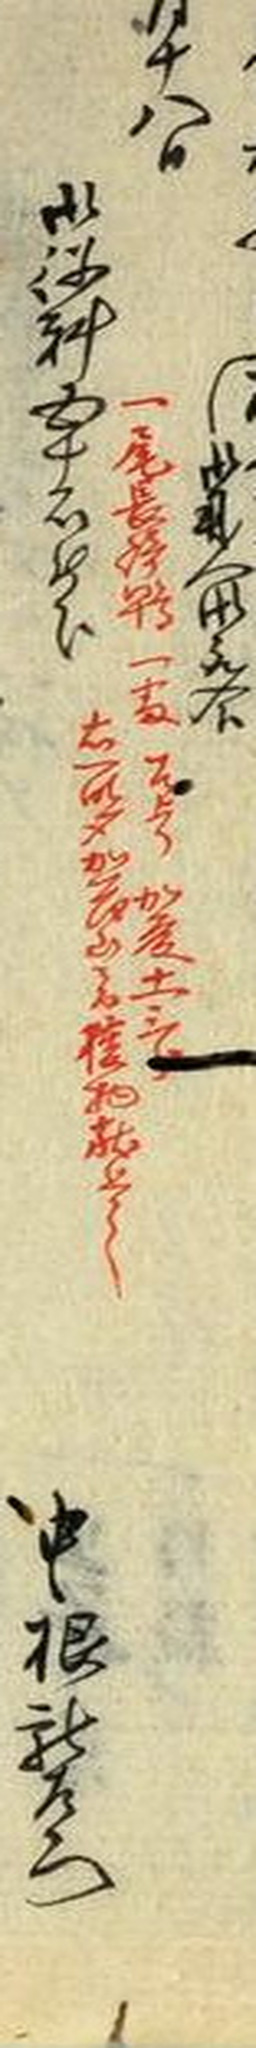御役料五十石被下中根新左衛門
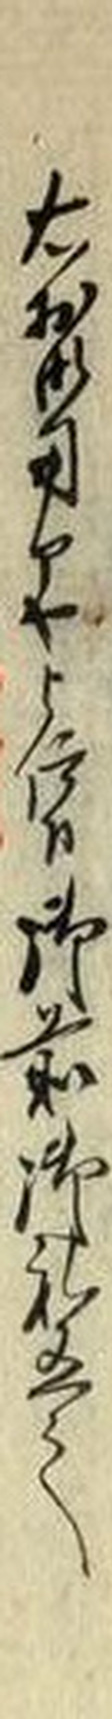右於御用部や被仰付御前御礼有之
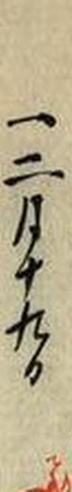一二月十九日
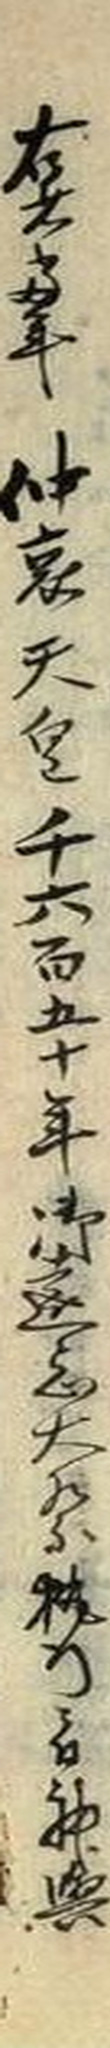右は当年仲哀天皇千六百五十年御遠忌大祭執行ニ付神輿
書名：少傅日録抄（斉承付側向頭取日記、在国）
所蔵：福井県文書館 Fukui Prefectural Archives
